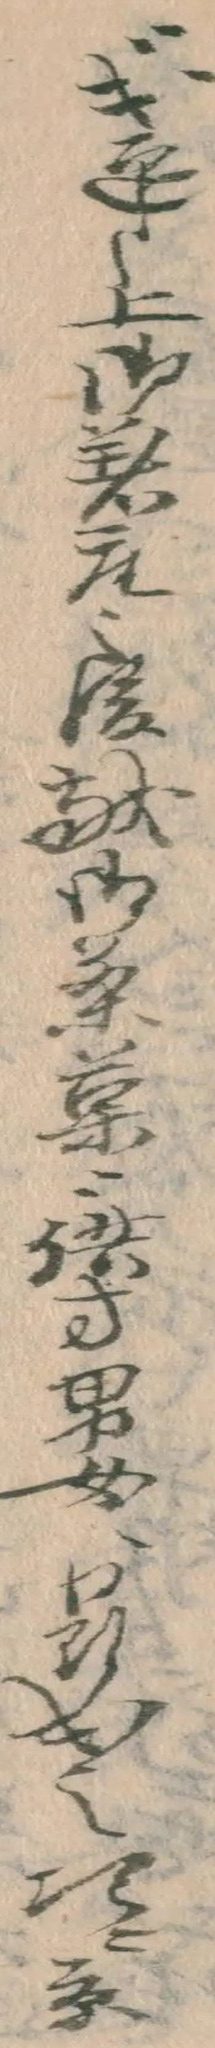御出連申上御着座之後献御茶菓御供方男女へ同断出之地ニ京
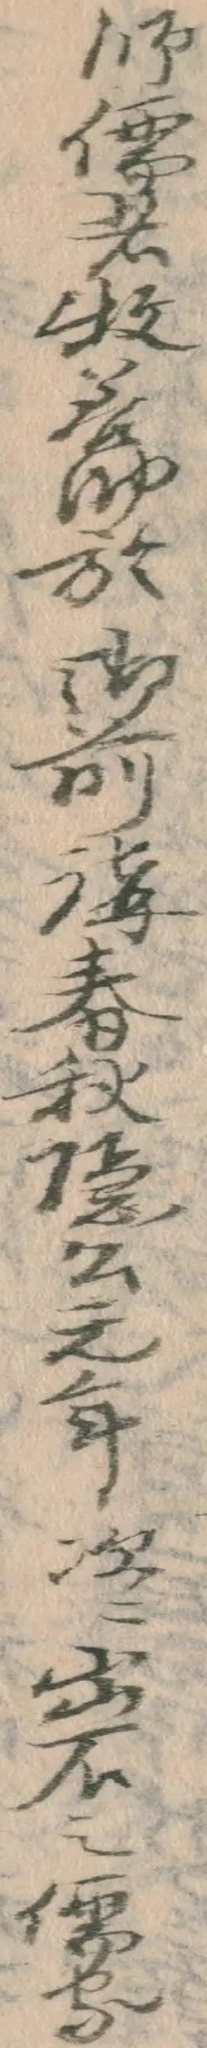師儒者牧善助於御前講春秋隠公元年次ニ出石之儒者
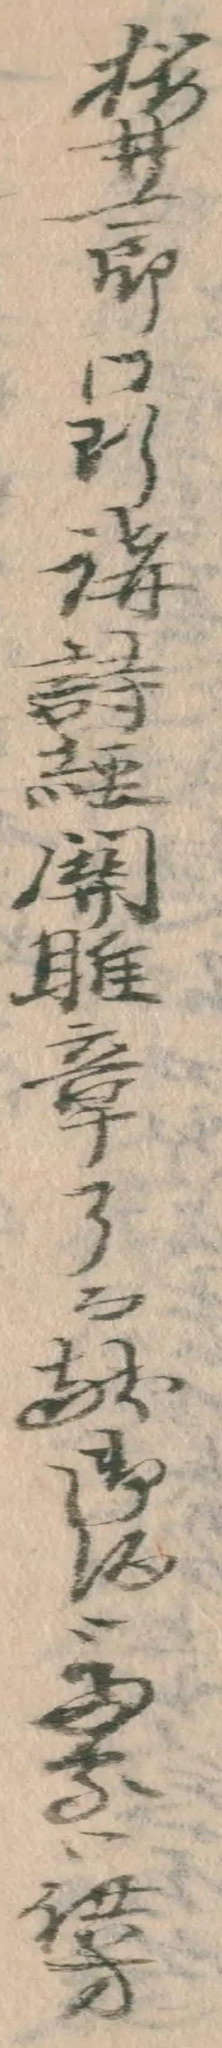桜井一郎同断講詩経関雎章了而献御酒御両家御供方
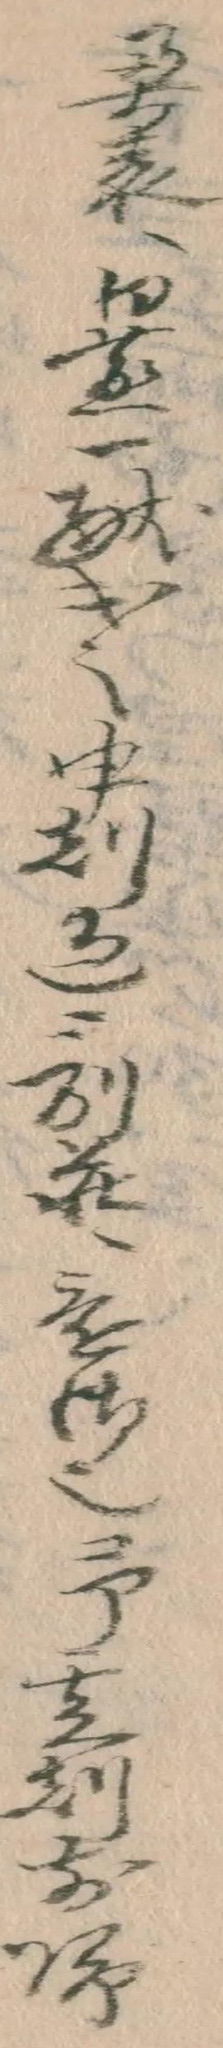奥表へ日昼一献出也申刻過御別荘へ御也予亥刻前帰
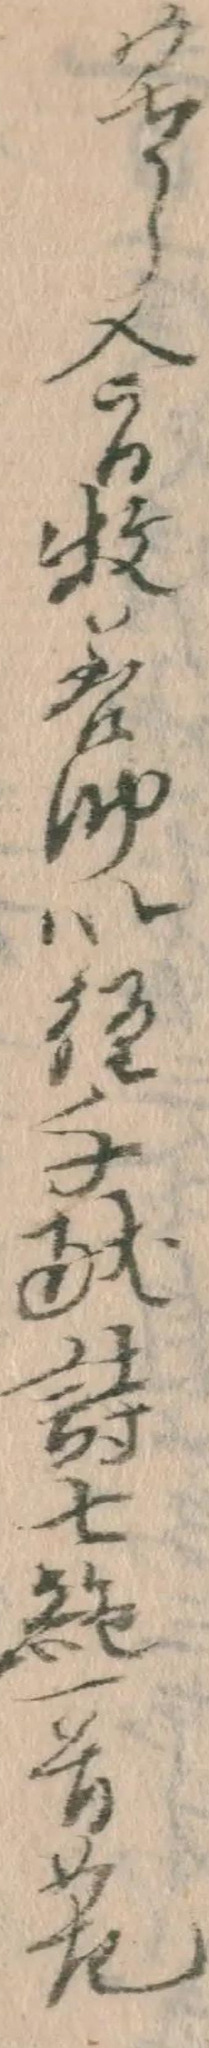筈了今日牧御介以経千献詩七絶一首如左
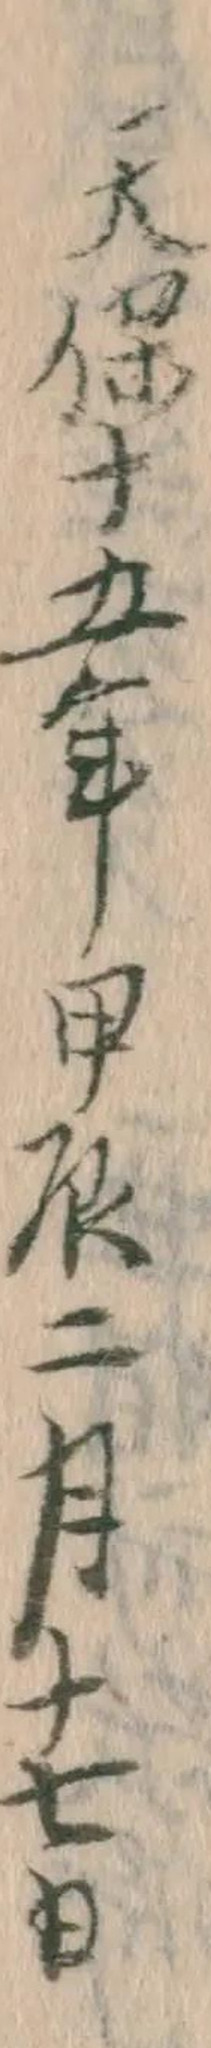天保十五年甲辰二月十七日
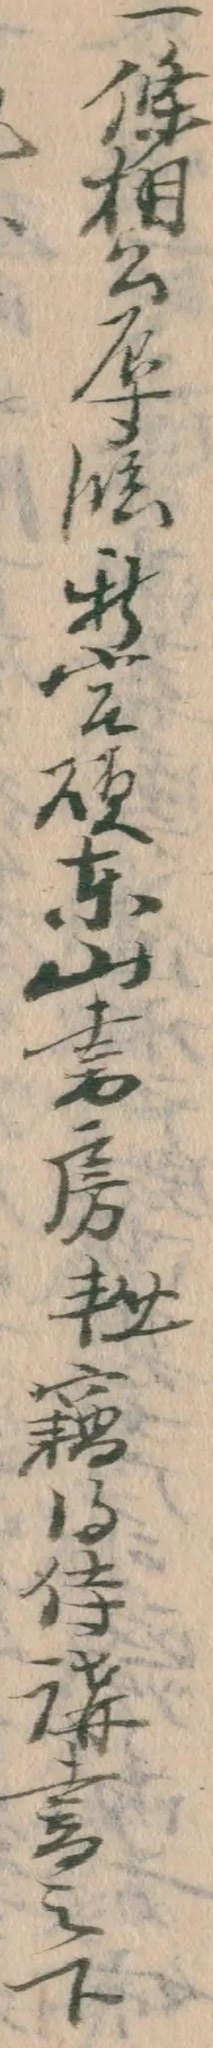一條相公辱法新宮碩東山書房書樋竊侍講書之下
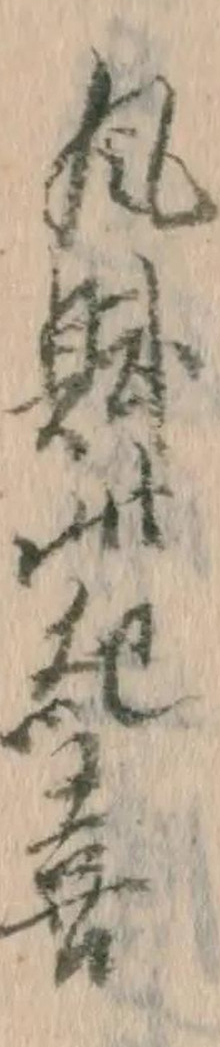風賦此紀喜
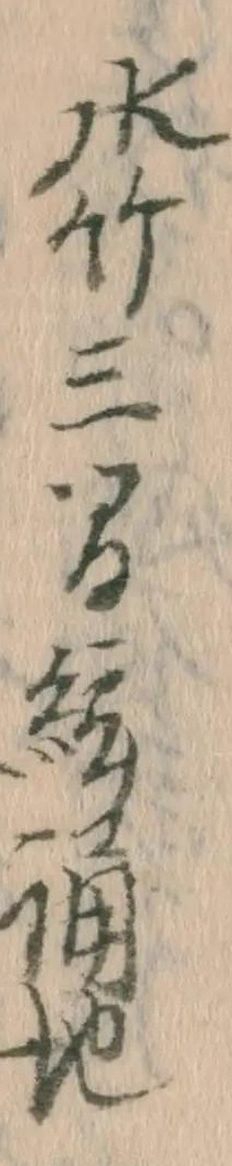水竹三間絃誦地
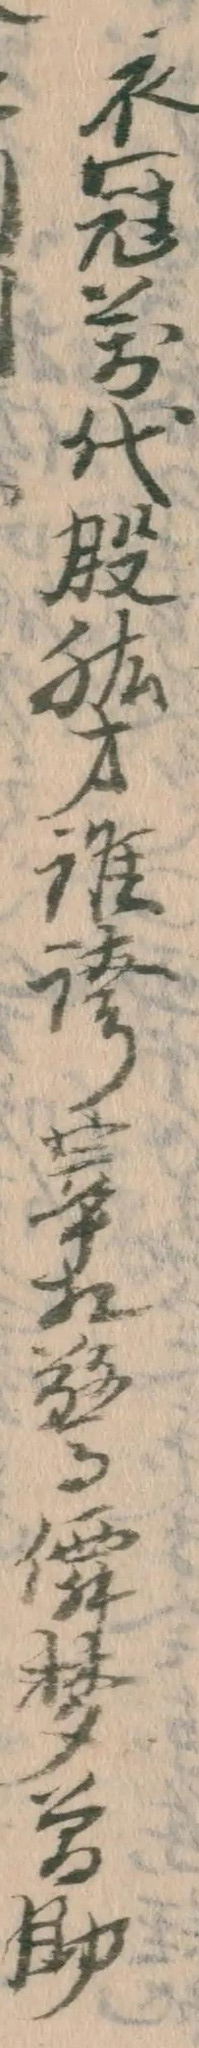衣冠萬代股肱方誰袴宰相驚儔夢曽助
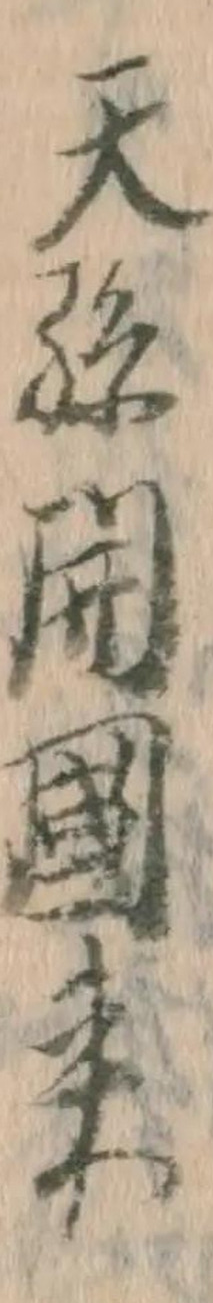天孫開国来
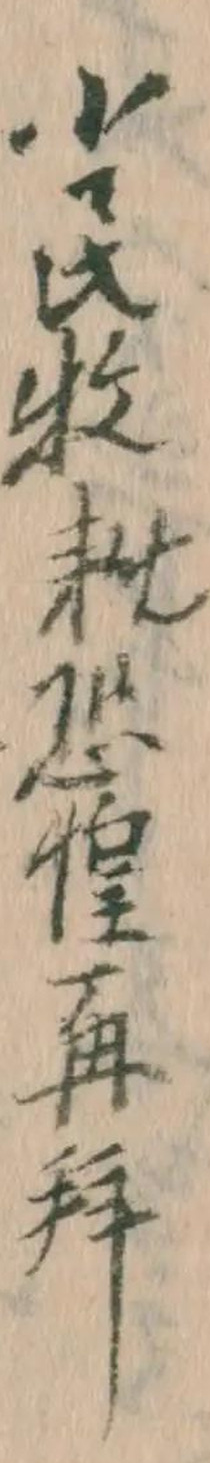小民牧頼恐惶再拝
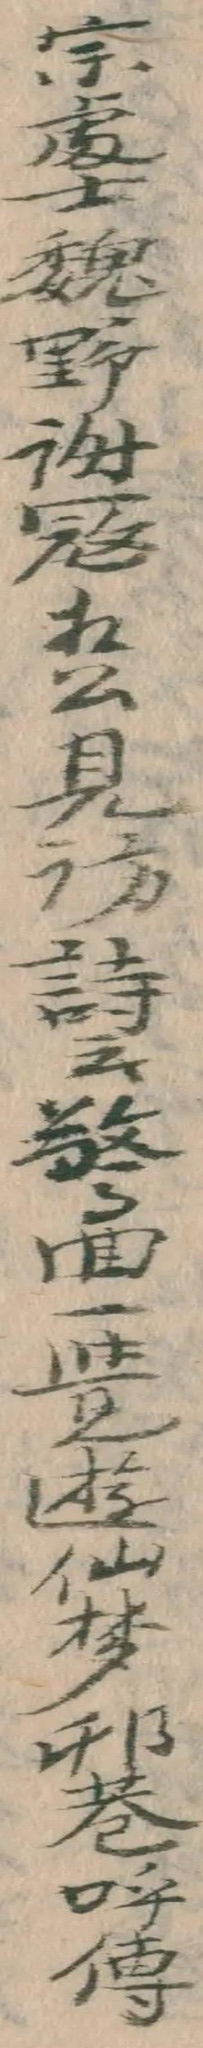宗虚士魏野謝冠相公見訪詩云驚回一覧遊仙夢邪巻呼傳
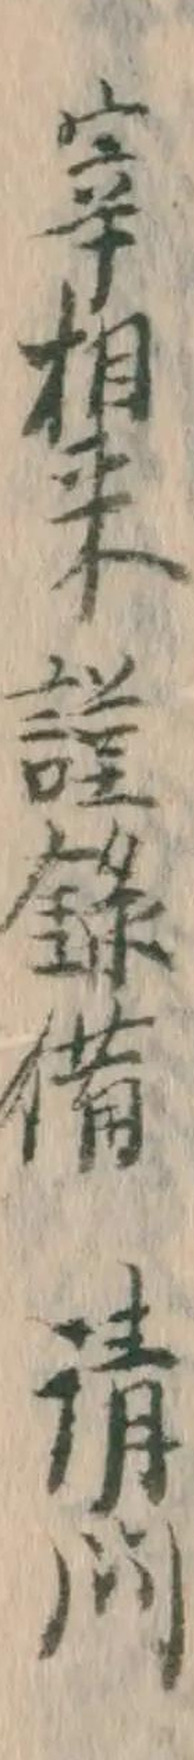宰相来謹録備申請問
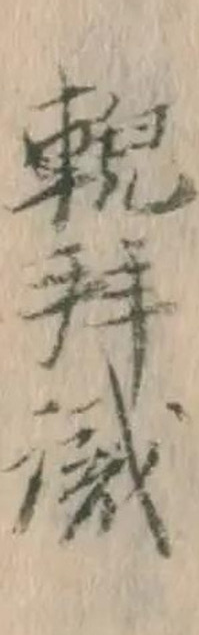乾拝識
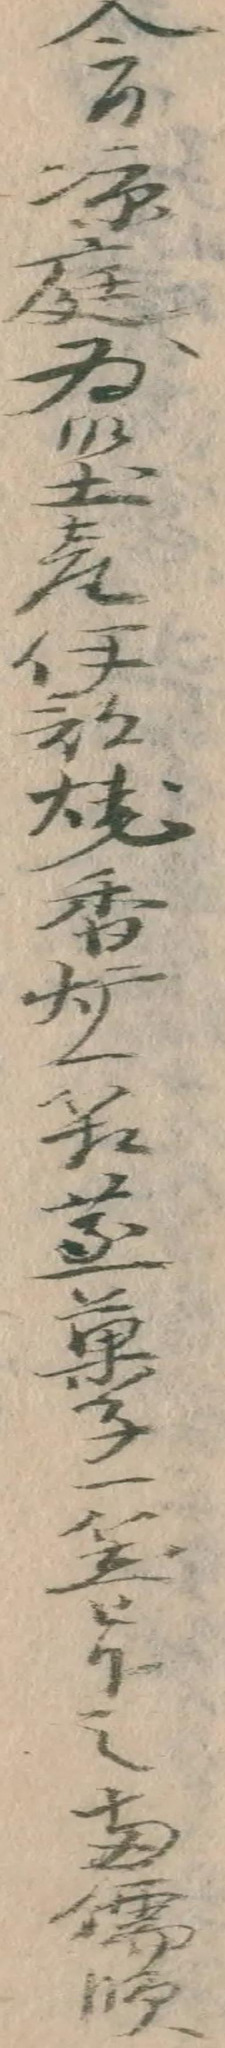今日涼庭為御土産伊部焼香炉一箱蒸菓子一笠被下之両儒晩
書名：賀茂社記録. 第69冊
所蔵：国立国会図書館 National Diet Library, JAPAN
